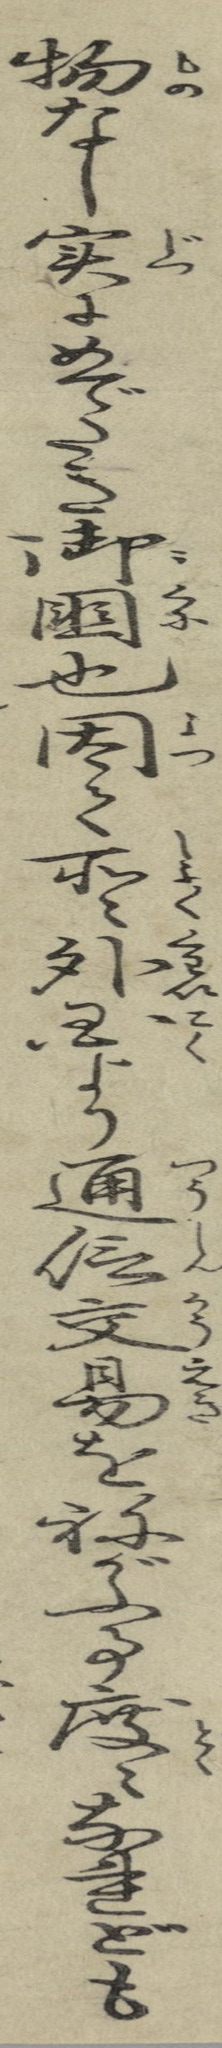物なし実にめでたき御国也因て所々外国より通信交易をねがふ事度〻なれども
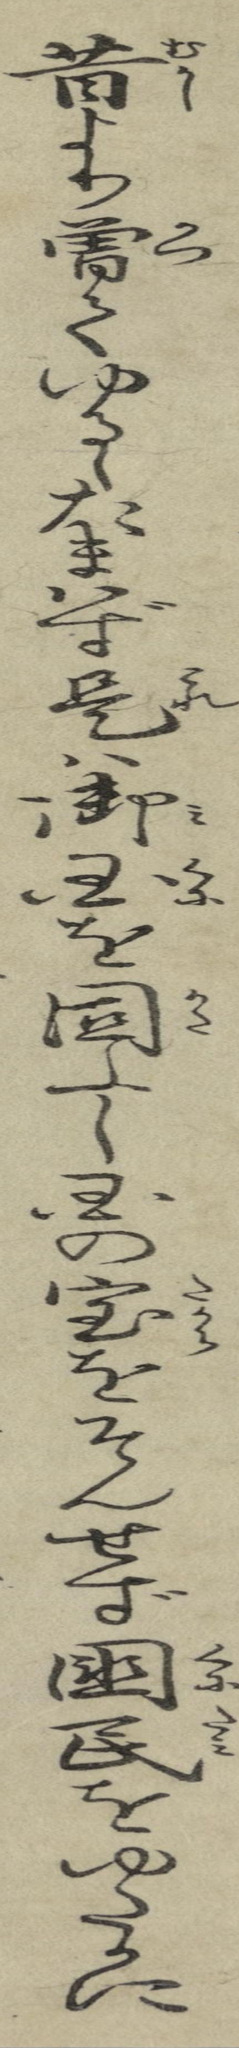昔より曾てゆるしたまはず是は御国を固ふし国の宝をそんせず国民をゆたかに
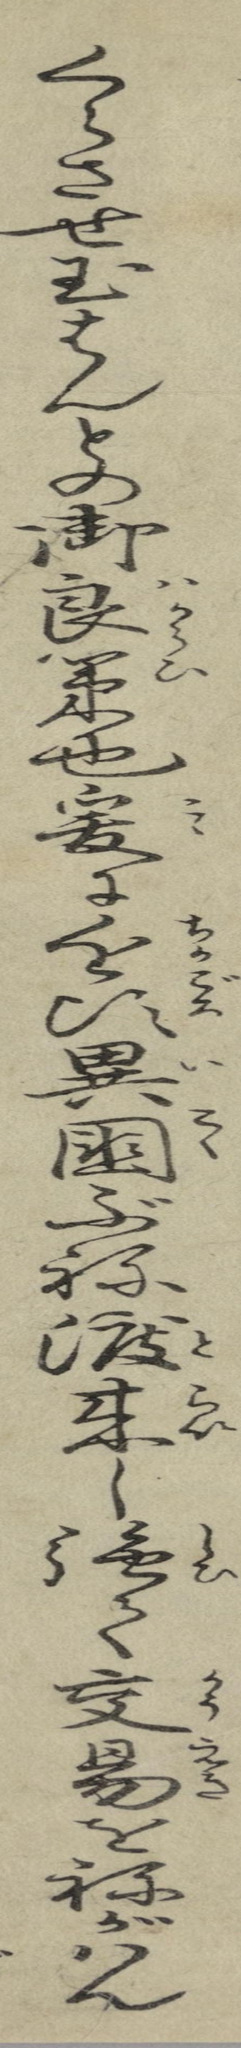くらさせ玉はんとの御良策也爰に近頃異国ぶね渡来し強て交易をねがはん
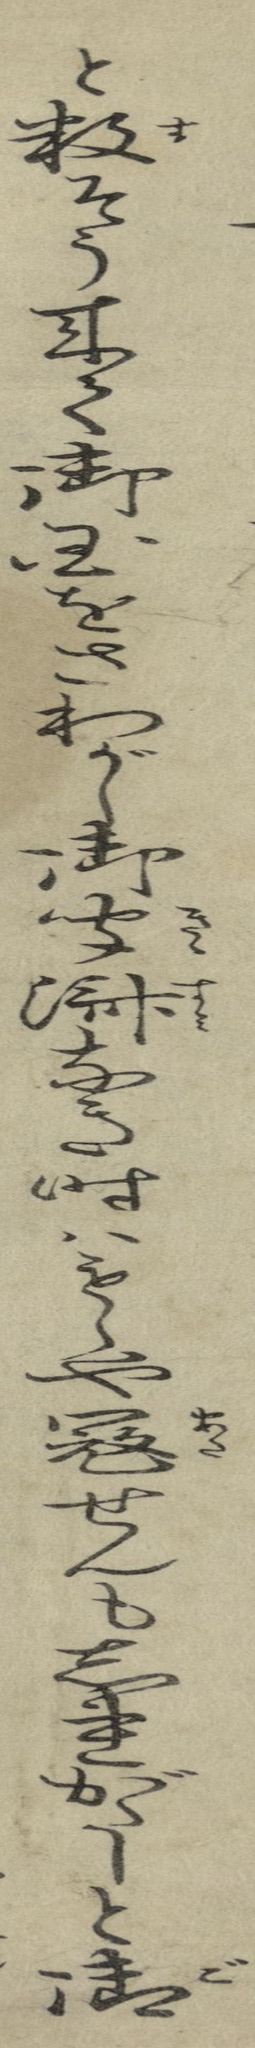と数そう来て御国をさわがし御聞済なき時はもしや寇せんもしれがたしと御
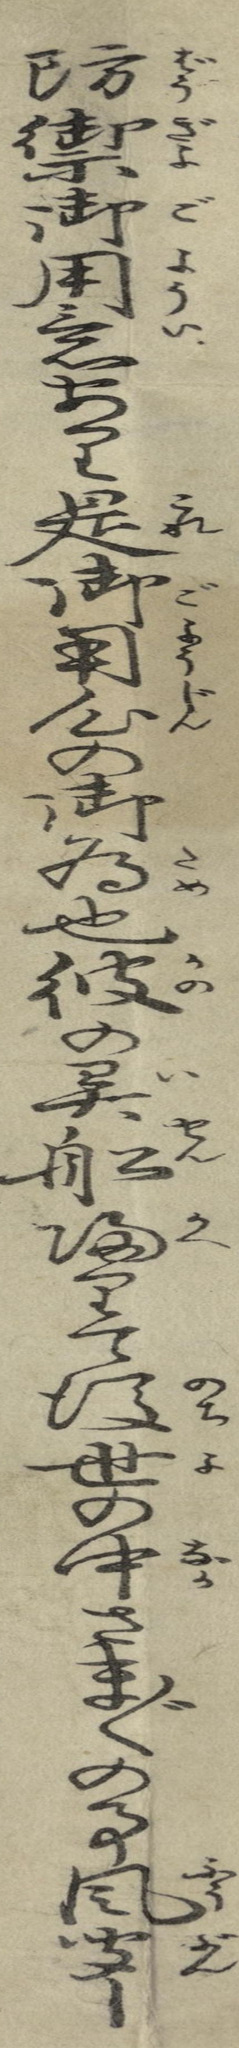防禦御用意あり是御用心の御為也彼の異船帰りて後世の中さま〴〵の事風聞し
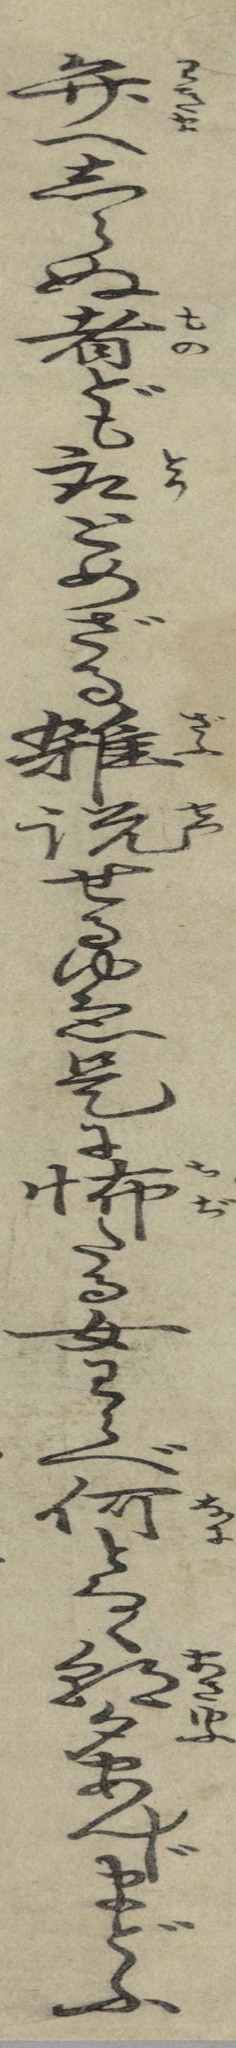弁へしらぬ者ども取とめざる雑説せるゆゑ是に怖たる女わらべ何となく朝夕あんじまどふ
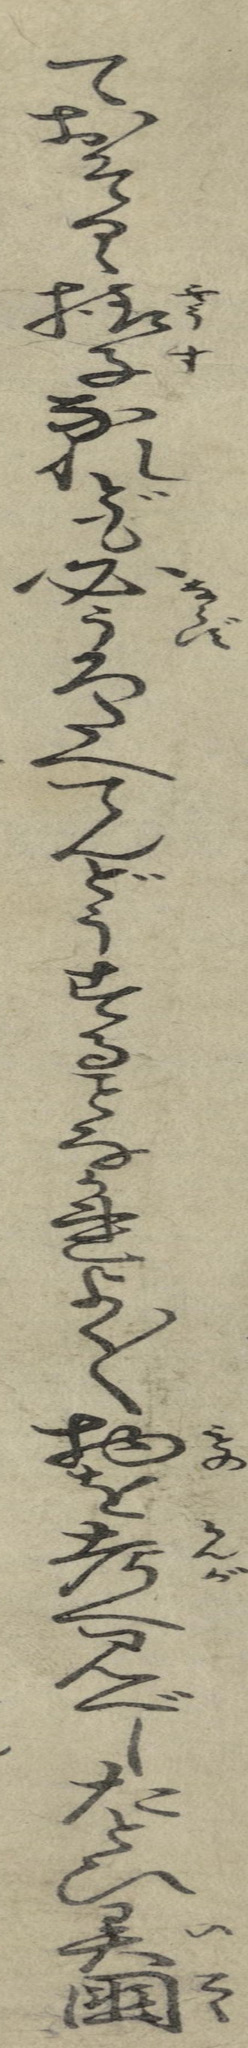ておそるゝ様子なれども必うろたへてんどうすることなれよく〳〵物を考へ見べしたとひ異国
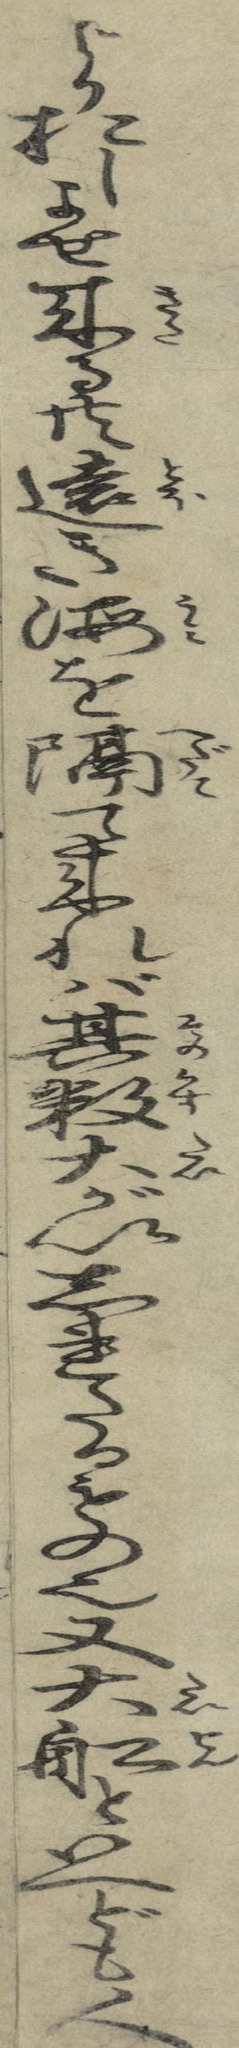よりおしよせ来る共遠き海を隔て来れば其数大がいたるもの也又大船といへども人
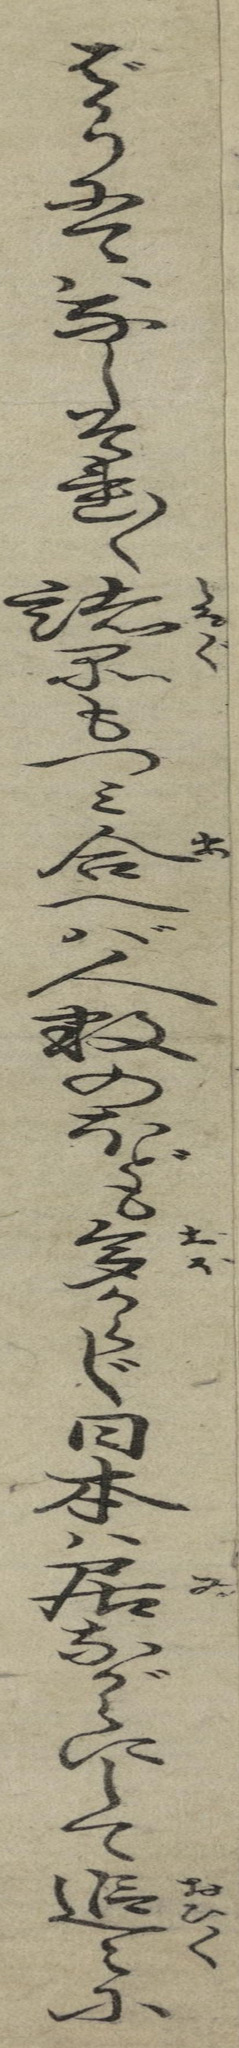ばかりにてはなしそれ〳〵諸品もつみ合へば人数のほども多からじ日本は居ながらにして追〻おひ〳〵に
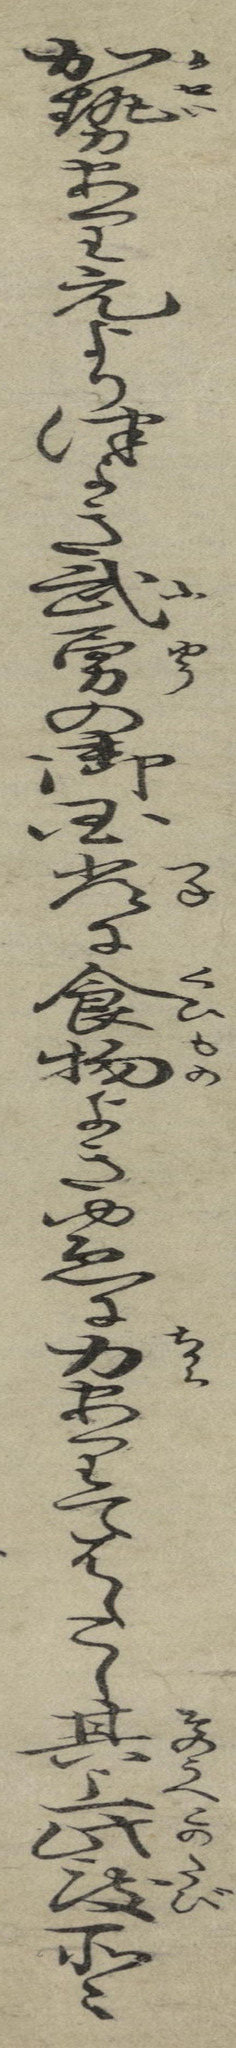加勢あり元よりつよき武勇の御国常に食物よきゆゑに力ありてはしこし其上此度所〻
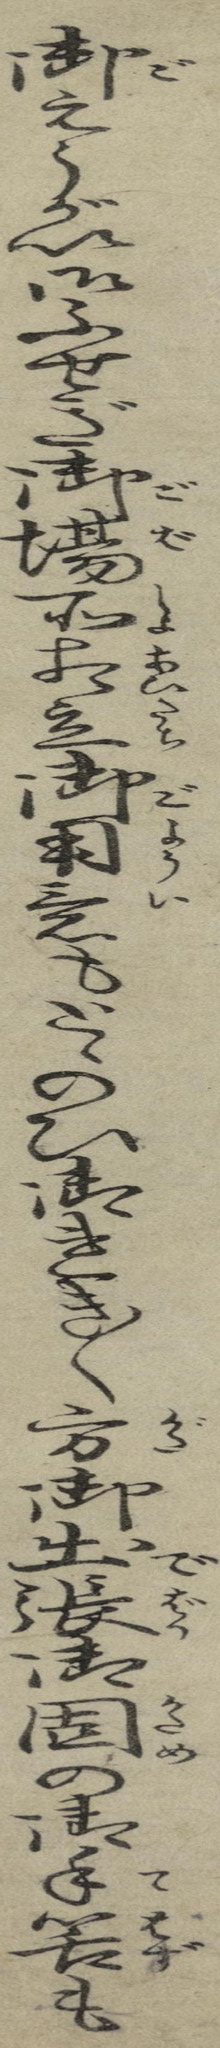御えうがい御ふせぎ御場所相立御用意もとゝのひ御れき〳〵方御出張御固の御手筈も
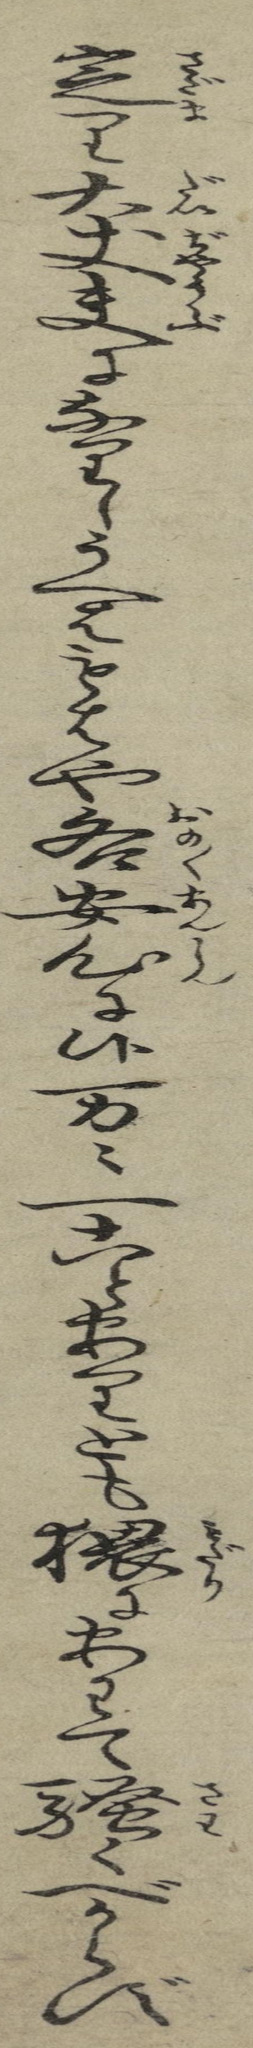定り大丈夫になりしうへもはや各安心に候万〻一ことありとも猥にありて騒くべからず
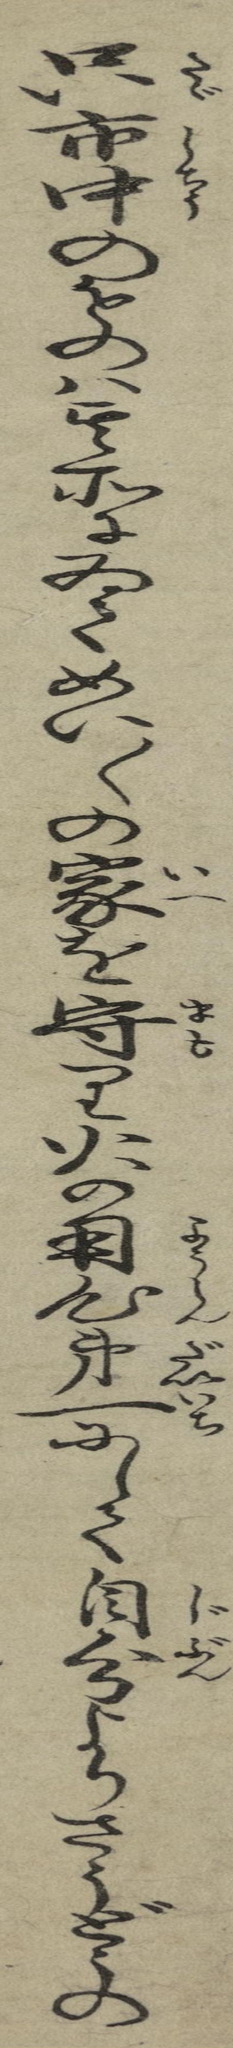只市中のものは其所にゐてめい〳〵の家を守り火の用心第一にして自分よりさうどうの
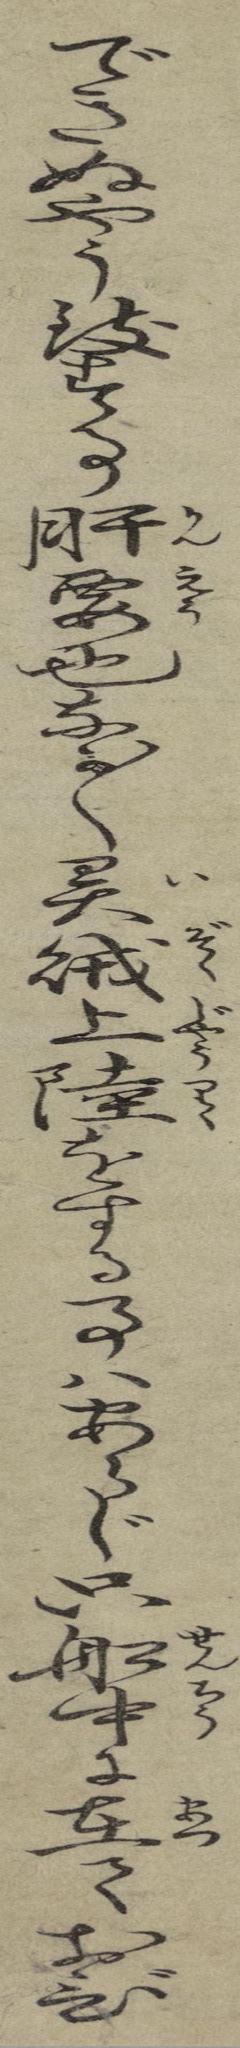できぬやう致す事肝要也なか〳〵異賊上陸をする事はあらじ只船中に在ておび
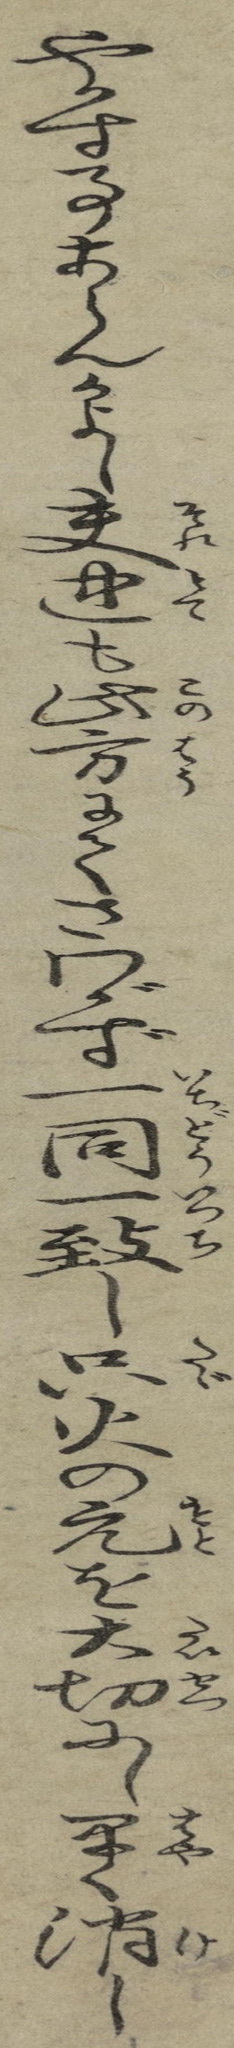やかす事あらんかよし夫迚も此方にてさわがず一同一致し只火の元を大切にし早く消し
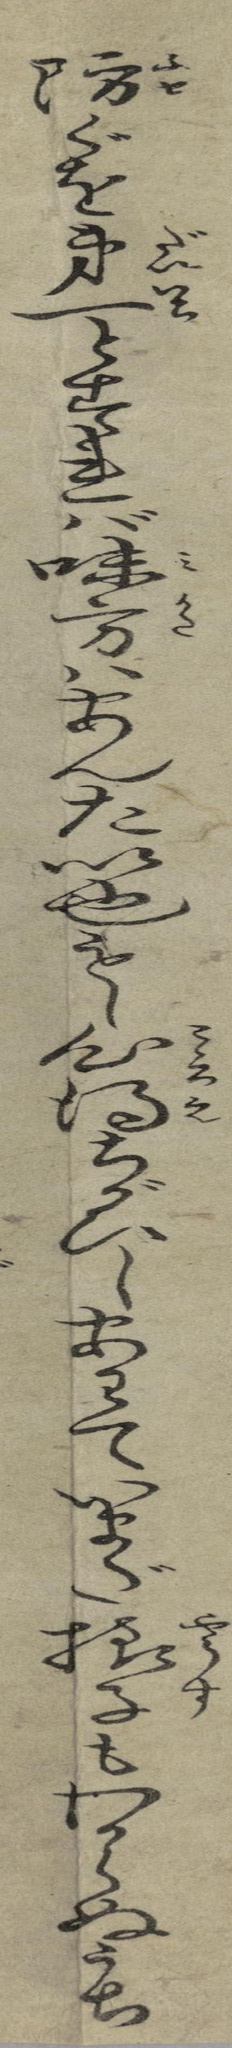防ぐを第一とすれば味方はあんたい也もし心得ちがひしありていまだ様子もわからぬうち
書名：火の元用心肝要之事・諸人安全心得の事
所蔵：東京大学地震研究所図書室 Earthquake Research Institute Library, The University of Tokyo, JAPAN
